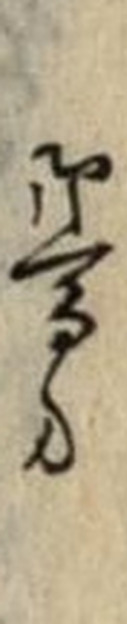御鷹方
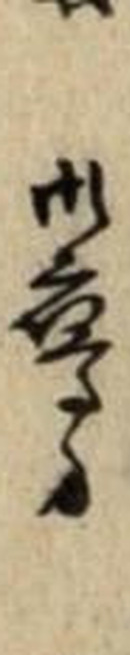御鷹方
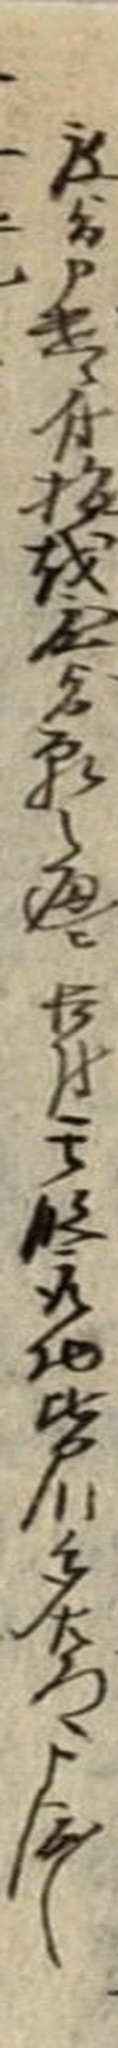度旨申遣候付指越度旨願之通被仰付其段取次皆川多左衛門へ申渡之
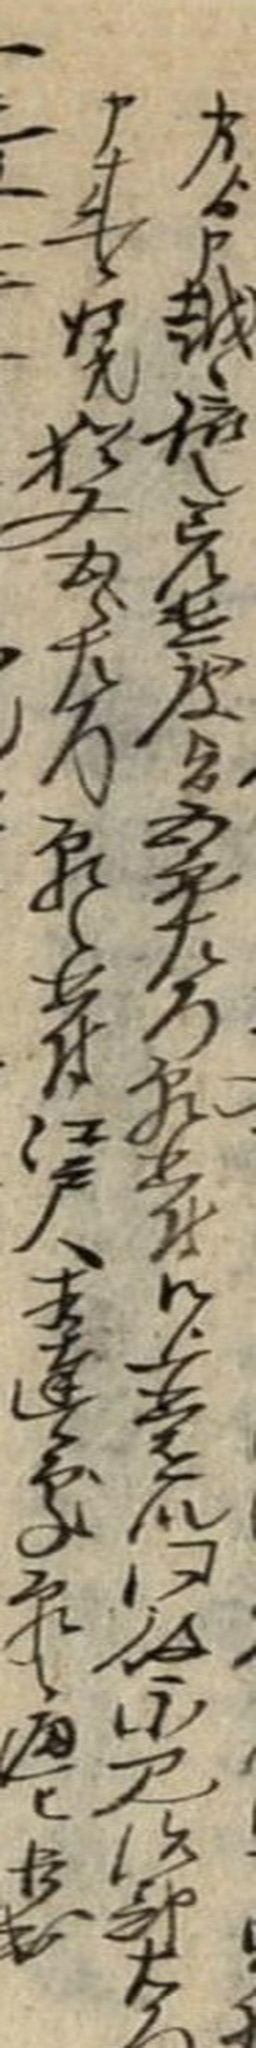申来候得共猶又五郎左衛門願之書付江戸へ相達候処願之通被仰出
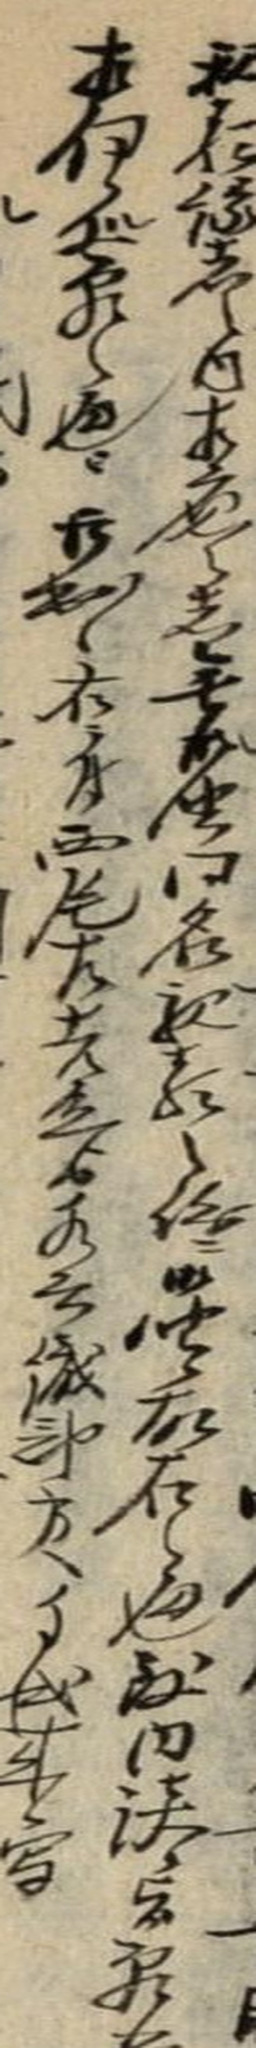相伺候処願之通被仰出候右ニ付西尾左吉殿ゟ水谷織部方へ手紙来候写
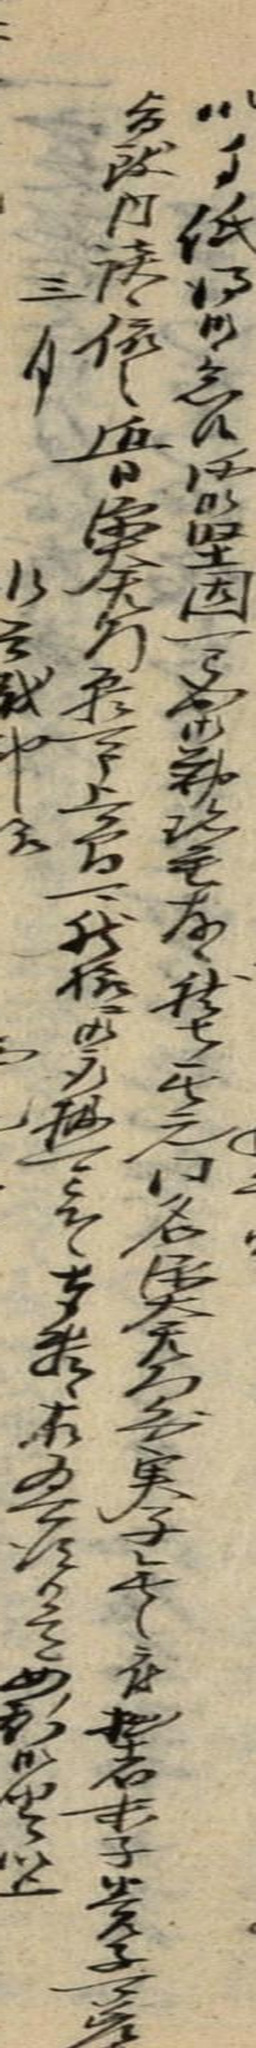旨致内談候依之近日源太左衛門願可申上候間可然様ニ御取扱可被下候奉願候右為可得御意如斯御坐候以上
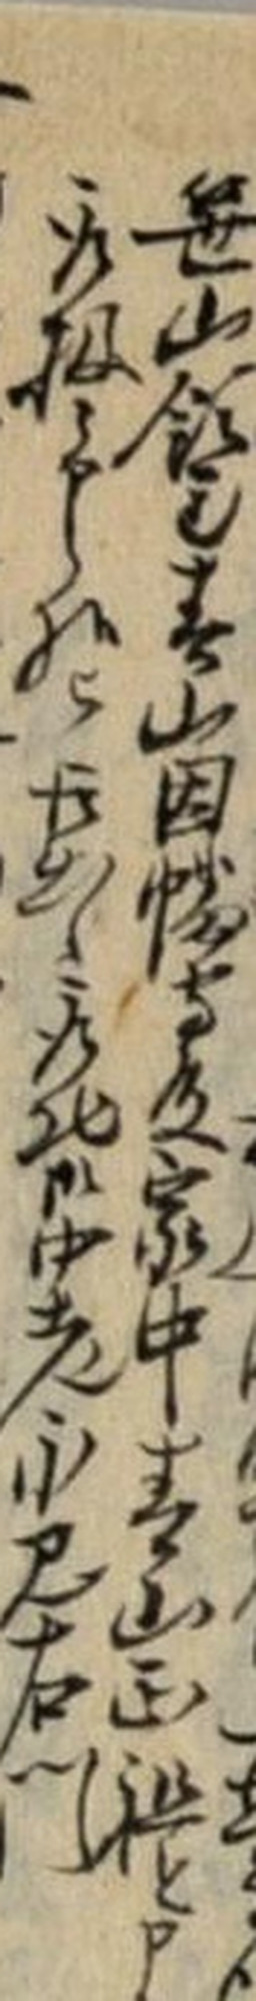取扱被申様被仰出候取次御中老永見右門
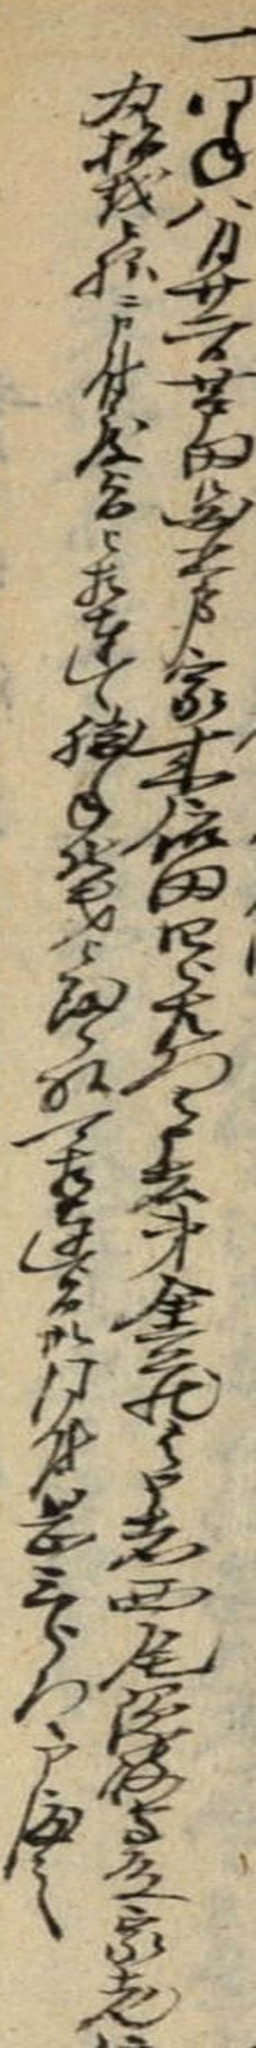為指越候様ニ申付度旨被相達候勝手次第被致候様可相達旨御目付岡さぶ三郎右衛門へ申渡之

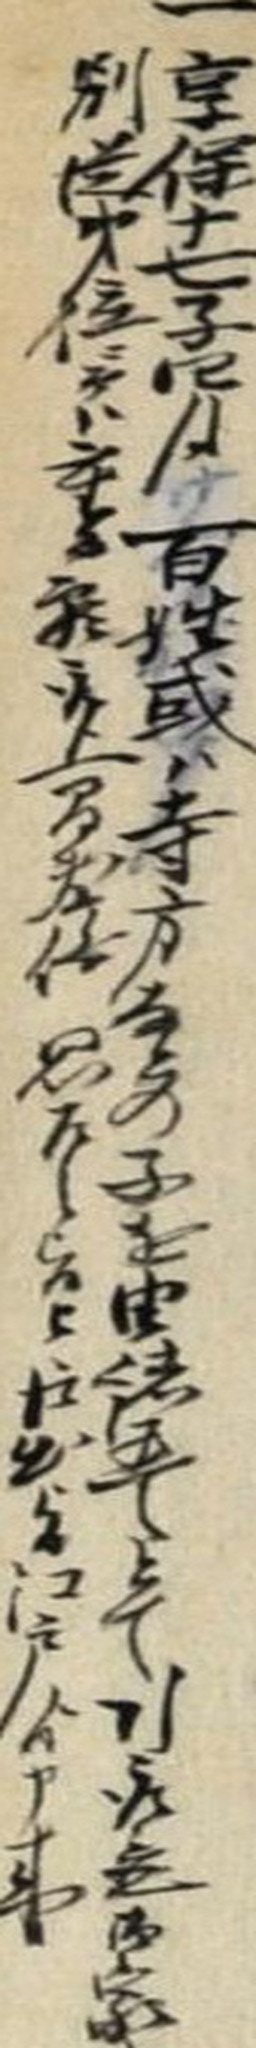別従位ニ而ハ重而願取上間敷儀思召之旨被仰出旨江戸ゟ申来
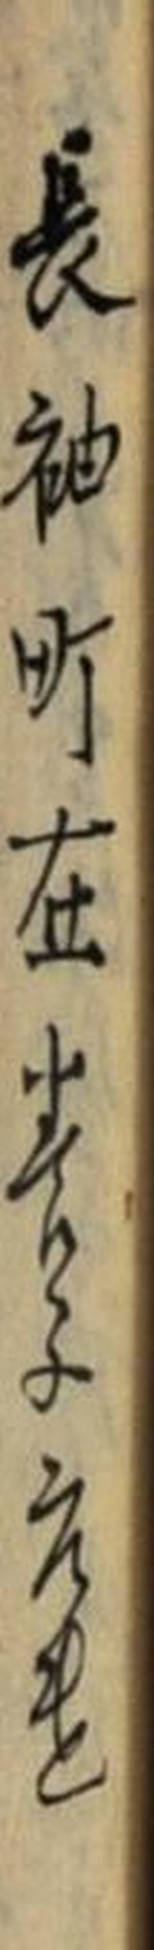長袖町在養子取遣
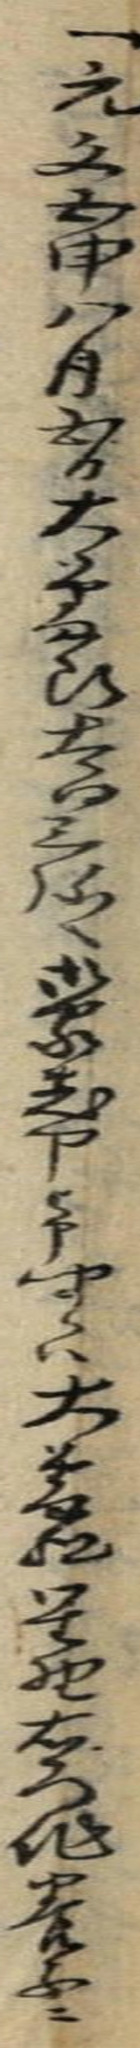一元文五申八月五日大御番頭太田三弥へ御家老中被申聞候ハ大御番組星野右衛門作養子ニ
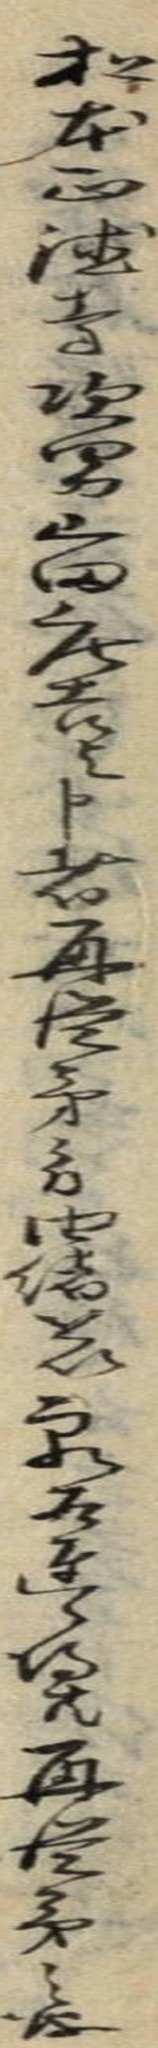松本正徳寺次男山田庄吉与申者再従弟ニ付由緒を以願相達候得共再従弟之儀
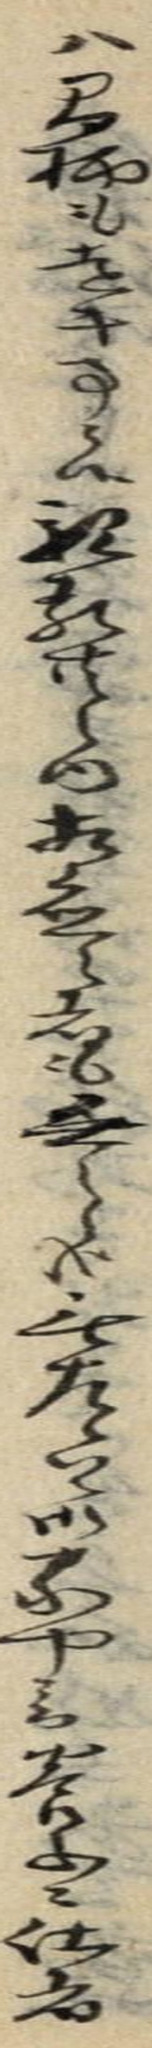ハ間柄も遠キ事ニ候親類共之内相応之者も無之哉無左候ハヽ御家中ニ而養子ニ仕者
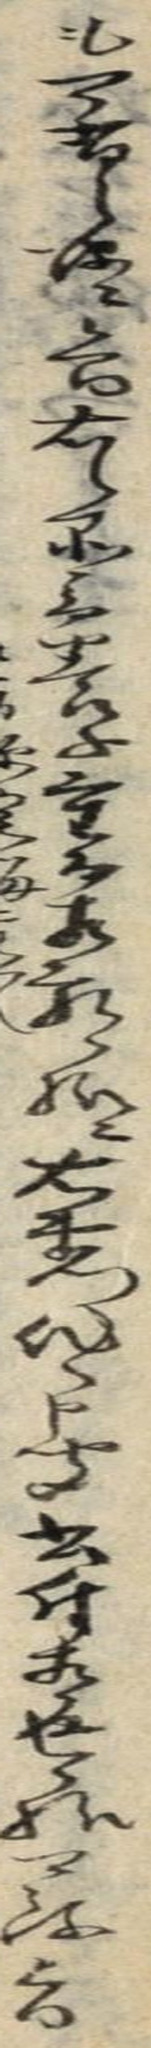も可有之儀ニ候間右之品ニ而養子重而相願候様ニ右衛門作へ申聞書付相返候様可致旨
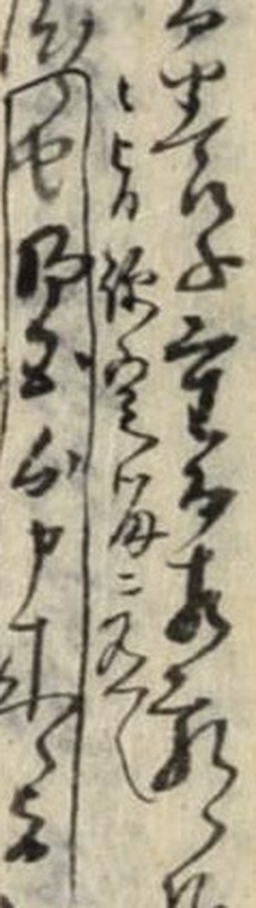候旨評定留ニ有之
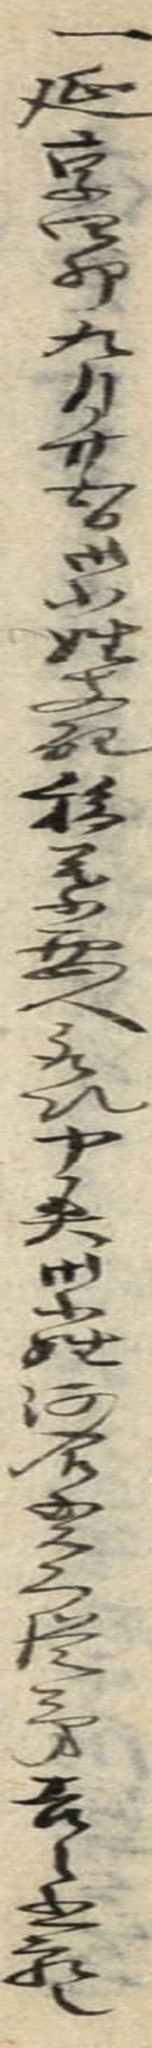一延享四卯九月廿五日御小姓支配稲葉要人取次中奥御小姓河合五右衛門従弟吉之丞願之
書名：養子縁組之部
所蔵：福井県文書館 Fukui Prefectural Archives
